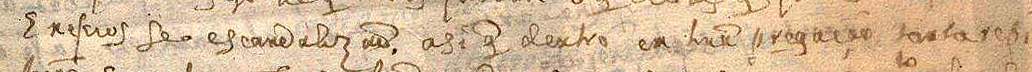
e nescios se escandalizão, asi q̄ dentro em huā pregação tanta repi
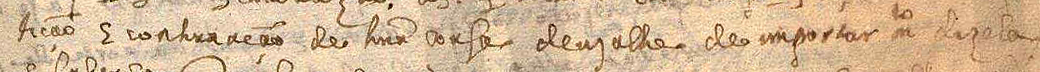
tição E continuaçaõ de huā deujalhe de importar mto dizela
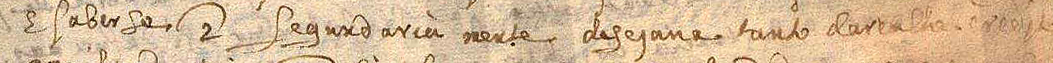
E saber se item segundariamente desejaua tanto darialhe credjto
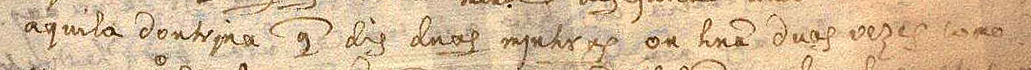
aquela doutrjna q̄ dis duas mjntiras ou huā duas vezes como se
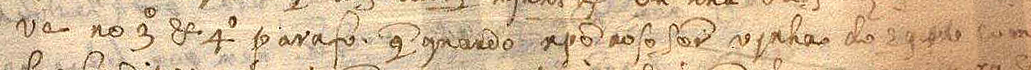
ve no 3o & 4o parafo. q̄ quando xpō noso sōr vjnha do E _ com
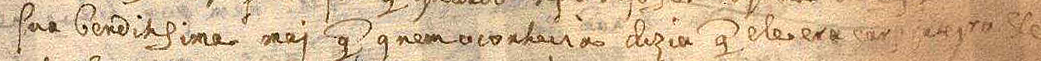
sua benditisima maj q̄ quem o conhecia dizia q̄ elle era carpyntejro E se
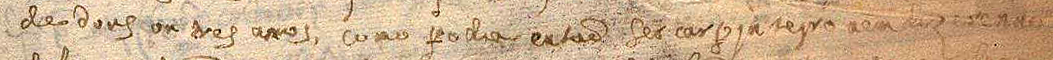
de dous ou tres anos como podia então ser carpjntejro nem dizer
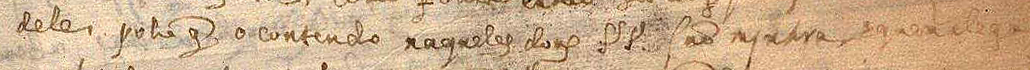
dele polo q̄ o conteudo naqueles dous SS. saõ mjntira, E quem alega
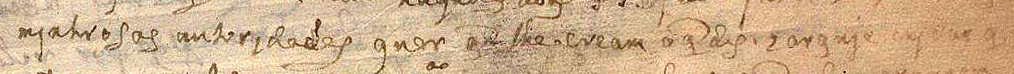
mjntirosas autoridades quer q̄ lhe cream o q̄ dis E arguje _ q̄
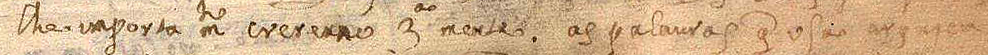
lhe importa mto crer erro 3a mente. as palauras q̄ vsa argujem
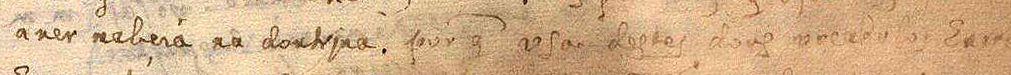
auer malicia na doutrjna. porq̄ vsa destes dous uocabulos E
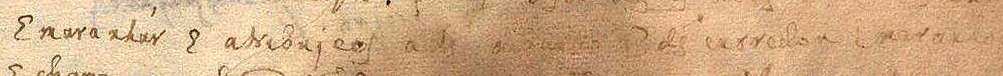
Emaranhar E atribujeos a si _ q̄ ds̄ enrredou e maranhou
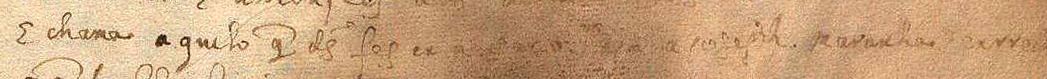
E chama aquilo q̄ ds̄ fes _ a joseph maranha enrredo
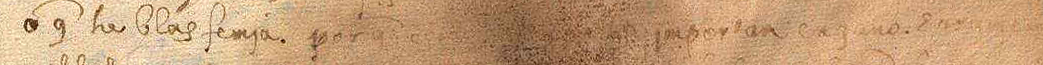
o q̄ he blasfemia porq̄ _ importam engano. E
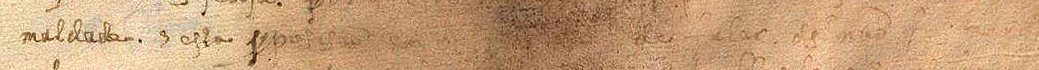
maldade E esta ꝓposição _ de falar ds̄ não
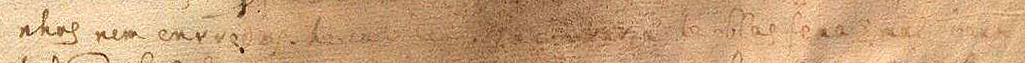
nhas nem enrredos. _ blasfema e
